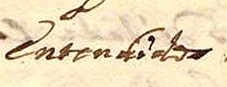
entendidos
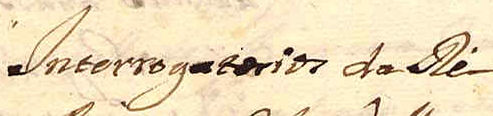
Interrogatorios da Ré
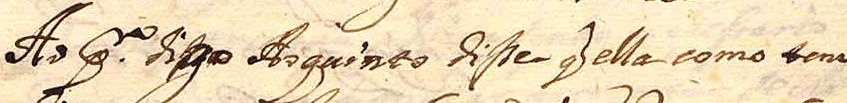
Ao p.ro digo Ao quinto disse q̄ ella como tem
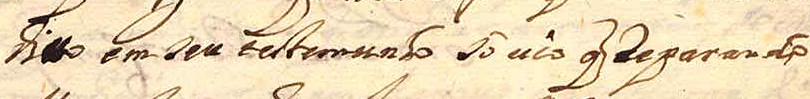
ditto em seu testemunho só uio q̄ Reparando
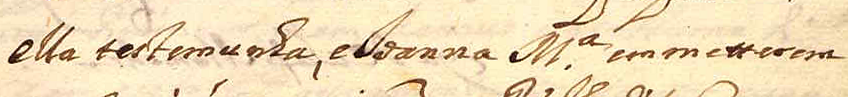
ella testemunha, e Ioanna M.a em metterem
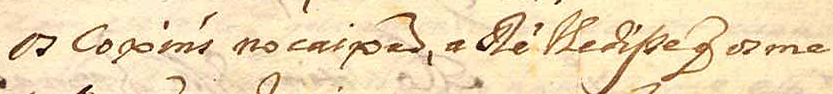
os coxins no caixaõ, a Ré lhe disse q̄ os me
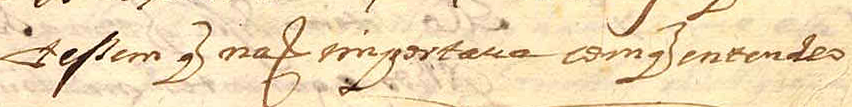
tessem q̄ naõ importaua com q̄ entendeo
